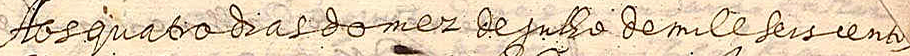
Aos quatro dias do mez de julho de mil e seiscento_
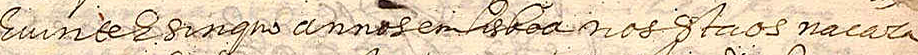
E uinte E sinquo annos em lisboa nos staos na caza
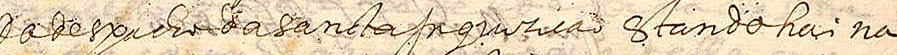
do despacho da sancta Jnquizicao stando hai na
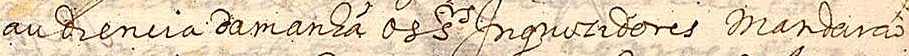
audiencia da manhā os sres Jnquizidores mandaraõ
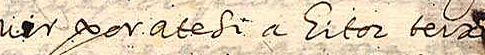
uir perate si a Eitor teix
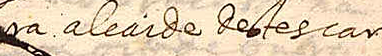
ra alcaide destes car
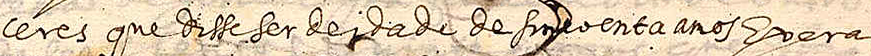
ceres que disse ser de idade de sincoenta annos E pera
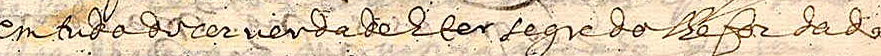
em tudo dizer uerdade E ter segredo lhe foi dado
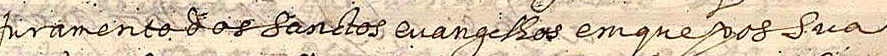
Juramento dos sanctos euangelhos em que por sua
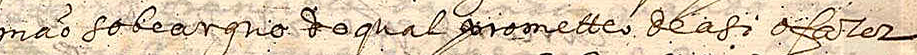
maõ sob carguo do qual prometteo de asi o fazer
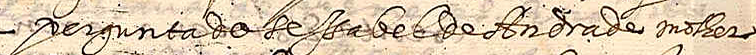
perguntado se Jsabel de Andrade molher
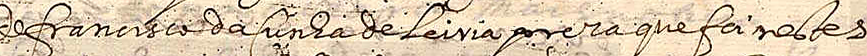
de francisco da Cunha de Leiria preza que foi nestes
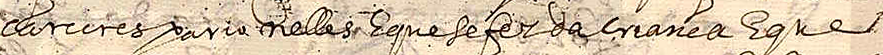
carceres pario nelles E que se fez da crianca E que
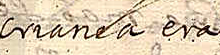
crianca era
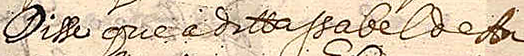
Disse que a ditta Jsabel de An
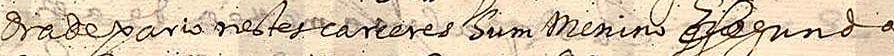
drade pario nestes carceres hum Menino E segundo
